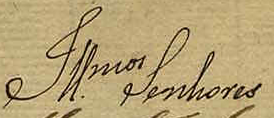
Ill.mos Senhores
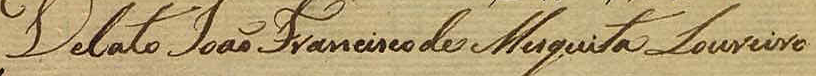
Delato Ioaõ Francisco de Mesquita Loureiro
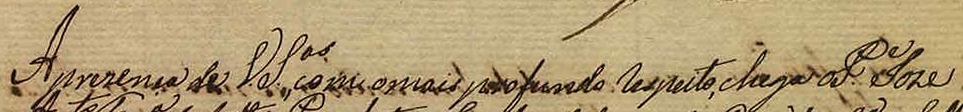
A prezença de V S.as, com o mais profundo Respeito, chega o P.e Ioze
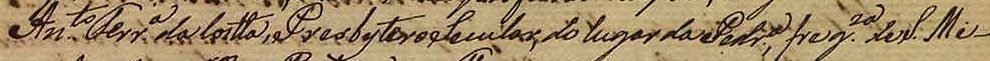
An.to Ferr.a da Costta, Presbytero Secular, do lugar da Pedr.a, freg.za de S. Mi
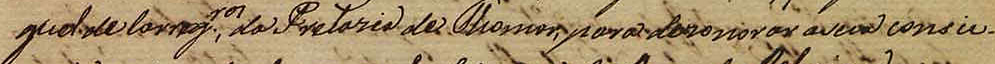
guel de Correg.ros, da Prelazia de Thomar, para dezonorar a sua consci
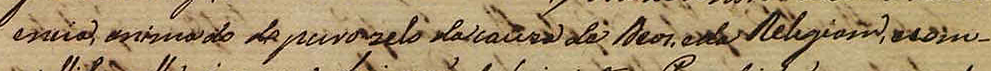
encia, animado de puro zelo da cauza de Deos, e da Religiam, e com
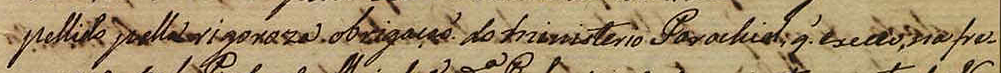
pellido pella rigoroza obrigaçaõ do ministerio Parochial; q̄ execeo, na fre
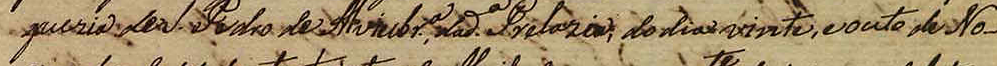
guezia de S. Pedro de Alviubr.a da d.a Prelazia, do dia vinte, e outo de No
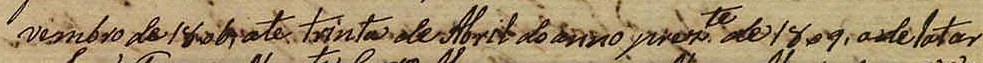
vembro de 1806, ate trinta de Abril do anno prez.te de 1809, a delatar
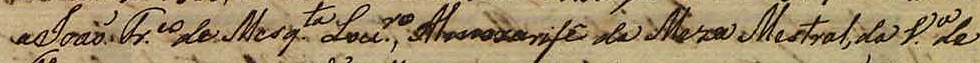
a Ioaõ Fr.co de Mesq.ta Lou.ro Almoxarifê da Meza Mestral, da V.a de
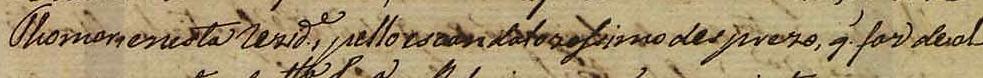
Thomar e nesta Rezid.e, pello escandalozessimo desprezo, q̄ faz de al
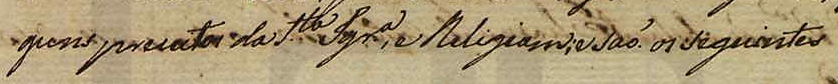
guns preceitos da S.ta Igr.a, e Religiam, e saõ os seguintes
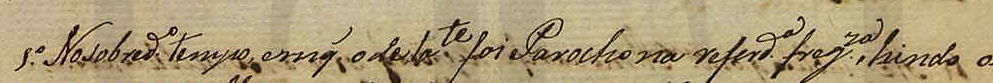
1.o No sobred.o tempo, em q̄ o dela.te foi Parocho na referd.a freg.za, hindo o
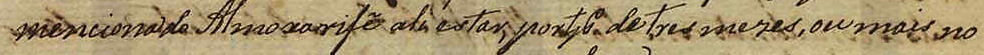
mencionado Almoxarife ali estar, por tp.o de tres mezes, ou mais no
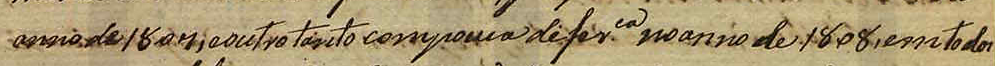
anno de 1807, e outro tanto com pouca difer.ça no anno de 1808, em todos
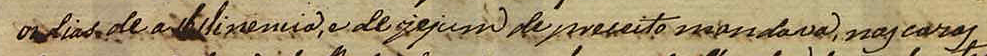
os dias de asbstinencia, e de jejum de preceito mandava, nas cazas
